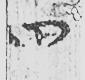田
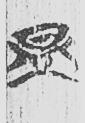昷
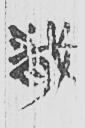歲
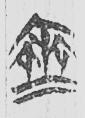齊
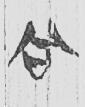冋
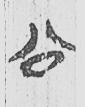公
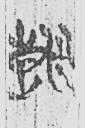朝
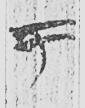于
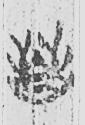晉
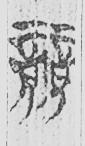競
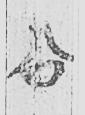公
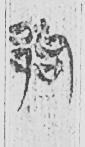邭
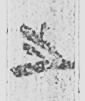之
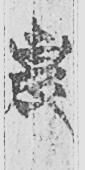尅
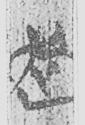走
